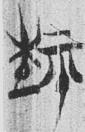○（社）
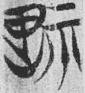○（稷）
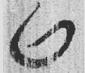㠯（以）
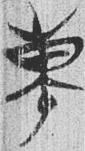東
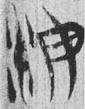海
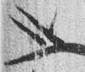之
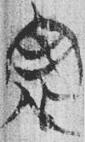表
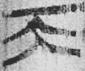天
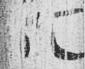亓（其）
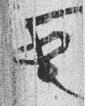𠁩（衷）
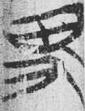卑（俾）
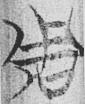周
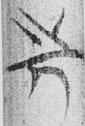先
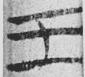王
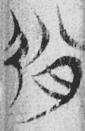佾
